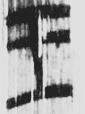王
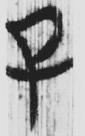子
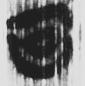回（圍）
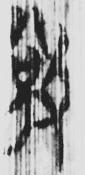敓（奪）
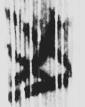之
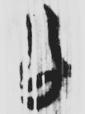公
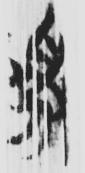爭
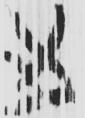之
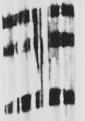王
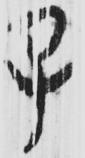子
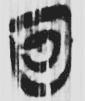回（圍）
